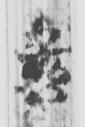孫
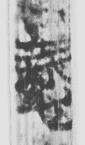𢝬
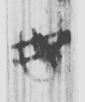女
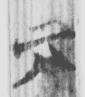亓
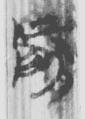所
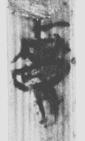貴
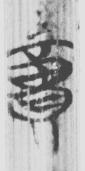{畐貝}
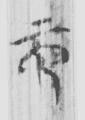而
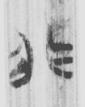非
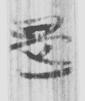是
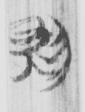則
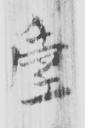危
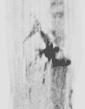身
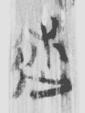述
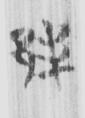邦
